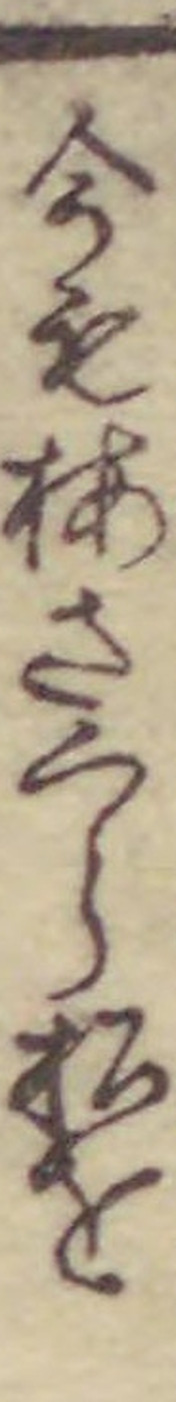今も梅さくら松を
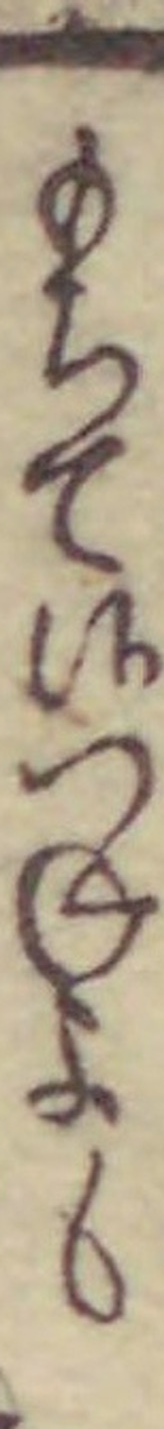もちて候つねにも
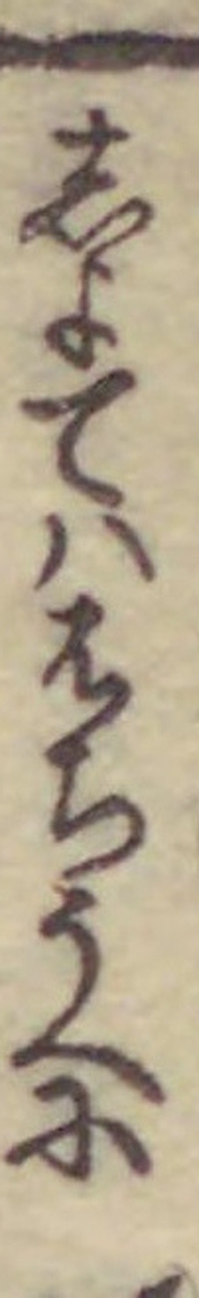しよてははちうへに
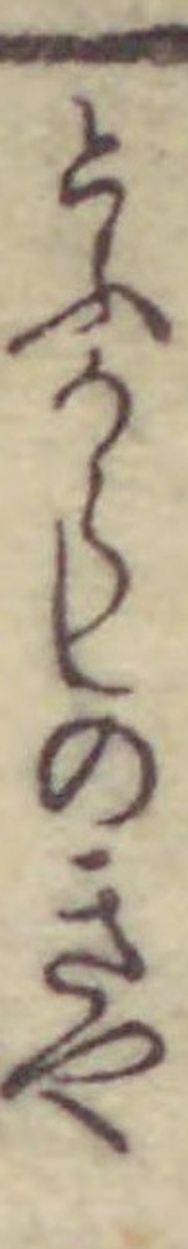とふからしのきや
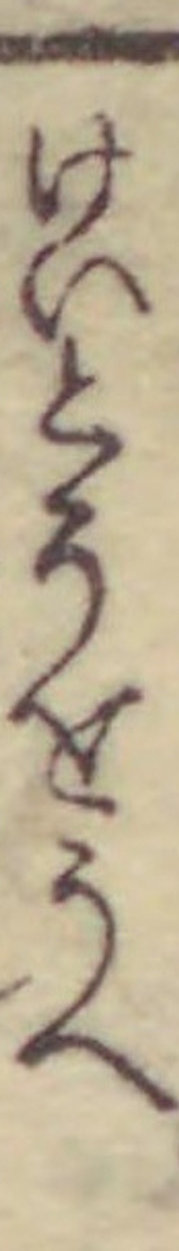けいとうをうへ
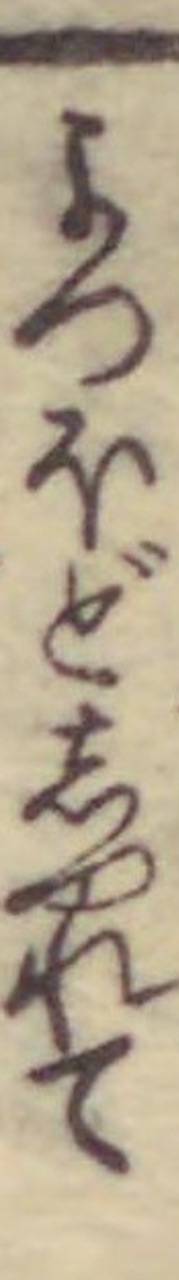よつほどしやれて
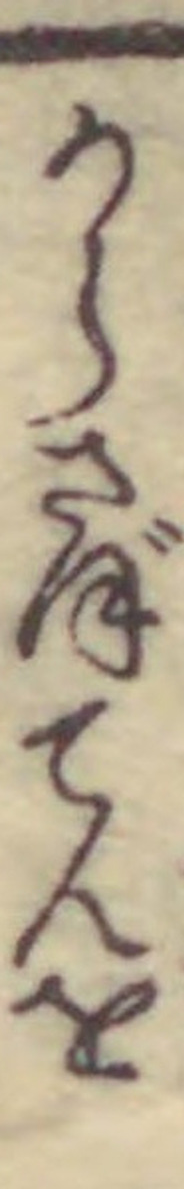からさぼてんを
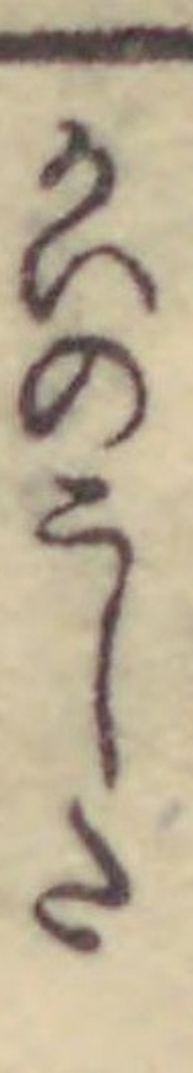かいのこした
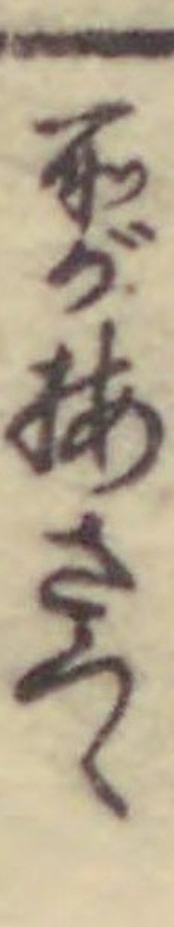所が梅さくら
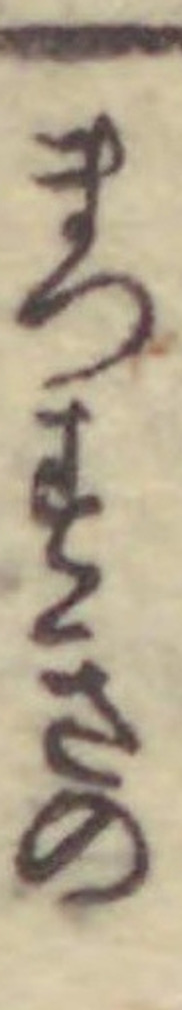まつすきの
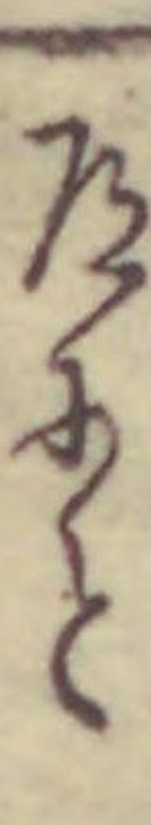道にと
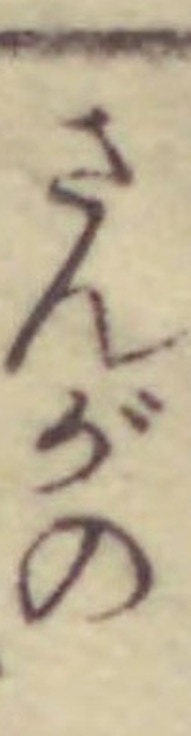さんがの
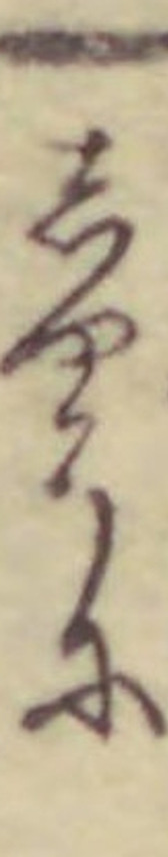しやうに
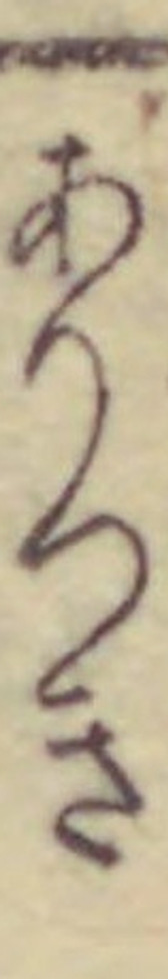ありつき
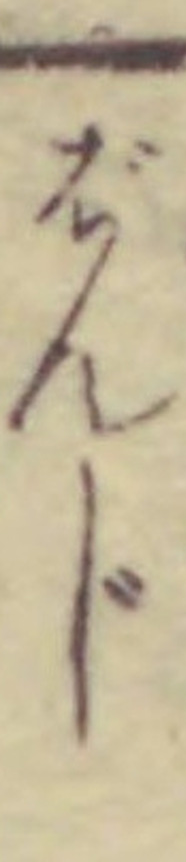ばんじ
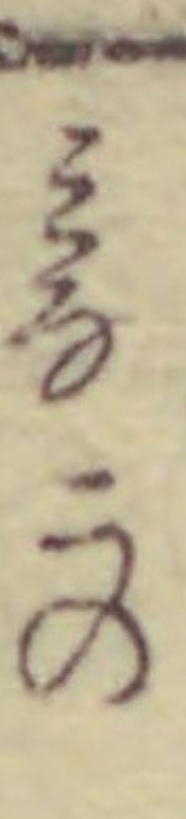みなこの
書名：大通人穴[サガシ] 3巻
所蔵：国立国会図書館 National Diet Library, JAPAN
